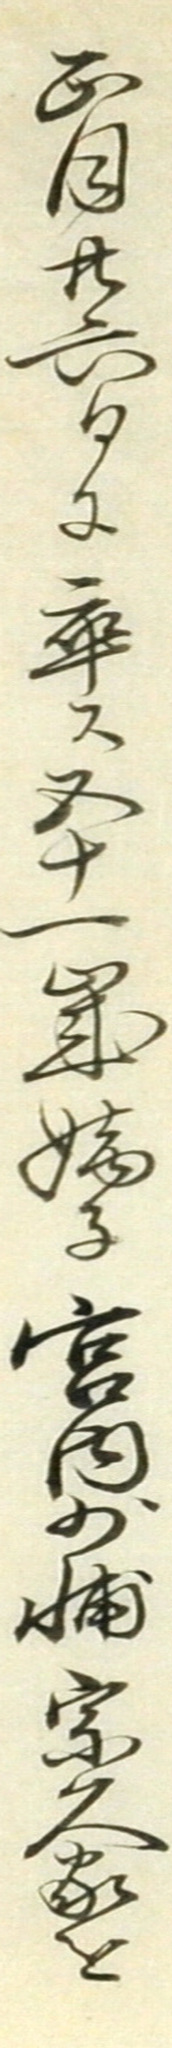正月廿六日に卒ス五十一歳嫡子宮内少輔宗久家を
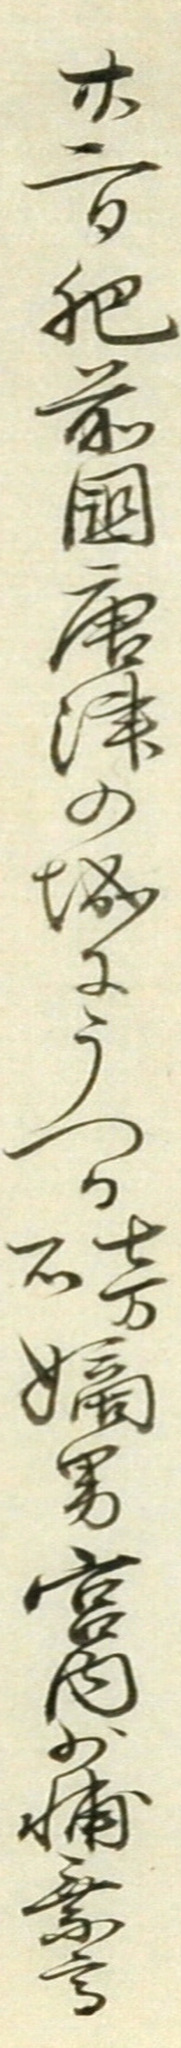廿二日肥前国唐津の城にうつる七万石嫡男宮内少輔乗高
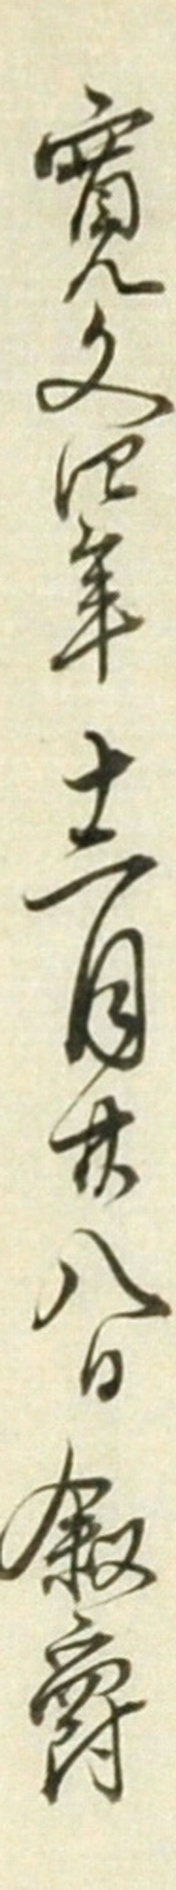寛文四年十二月廿八日叙爵

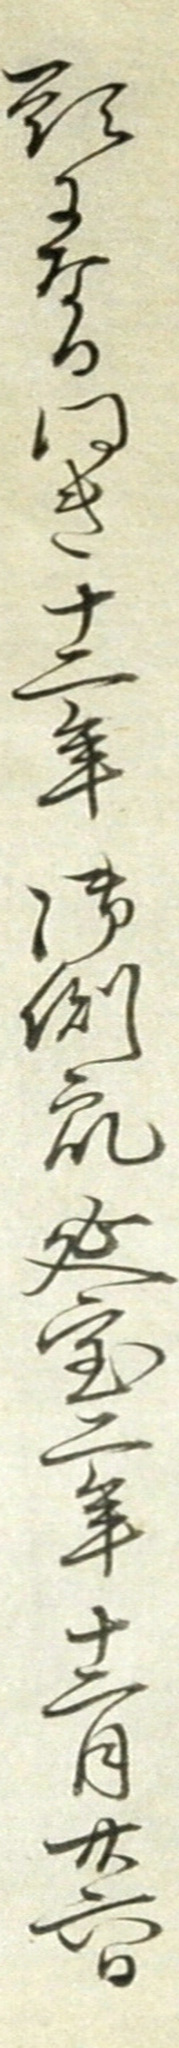頭になる同き十二年御側衆延宝二年十二月廿六日
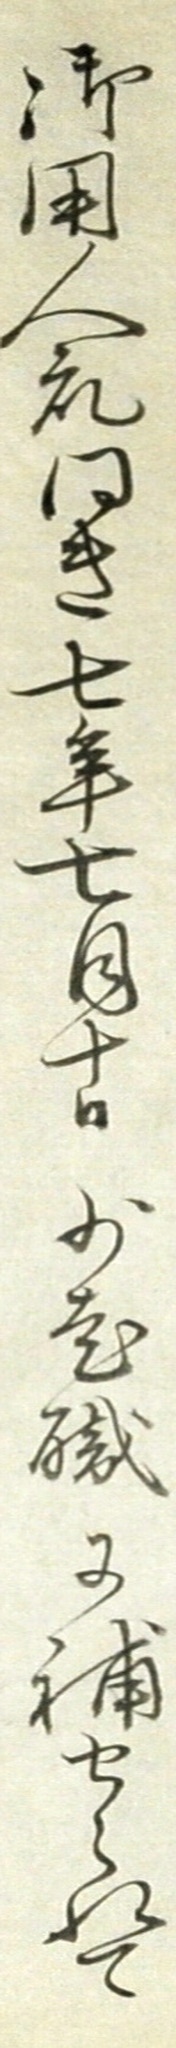御用人衆同き七年七月十日少老職に補せられて
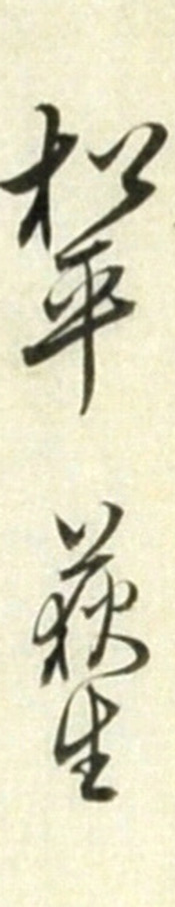松平荻生
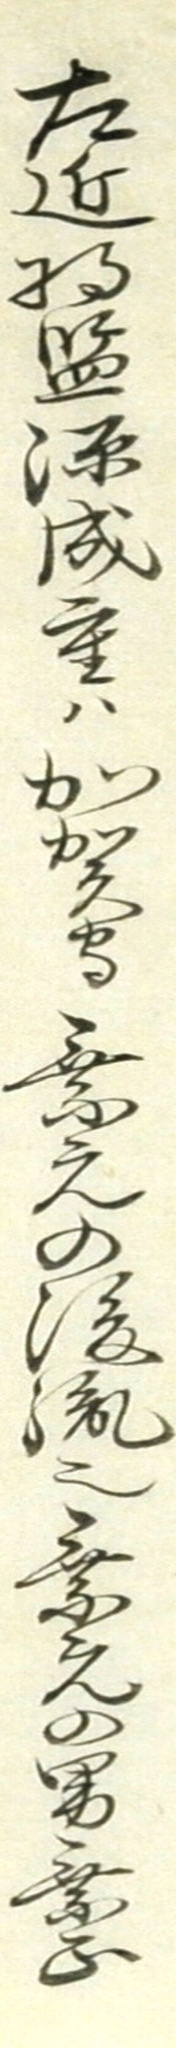左近将監源成重は加賀守乗元の後胤也乗元の男乗正
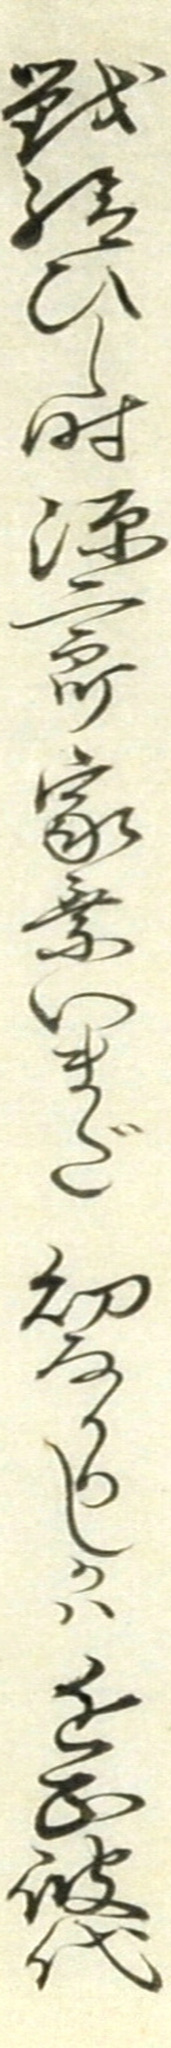戦給ひし時源二郎家乗いまだ幼なかりしかは近正彼代
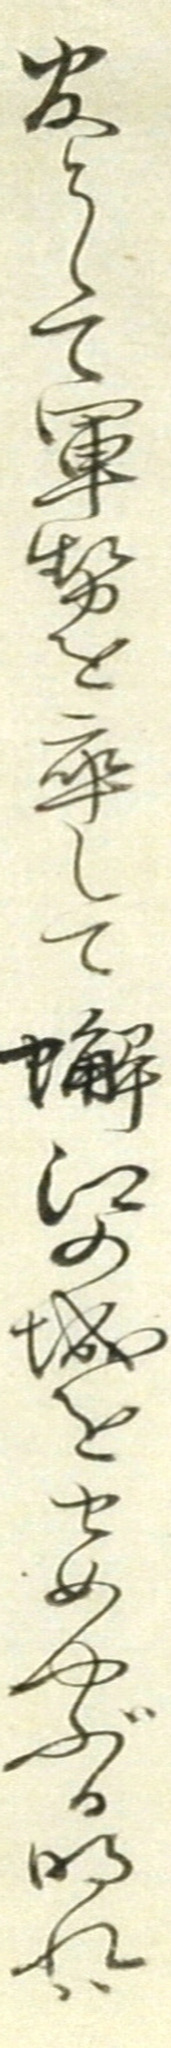官として軍勢を率して蟹江の城をせめやぶる明れは
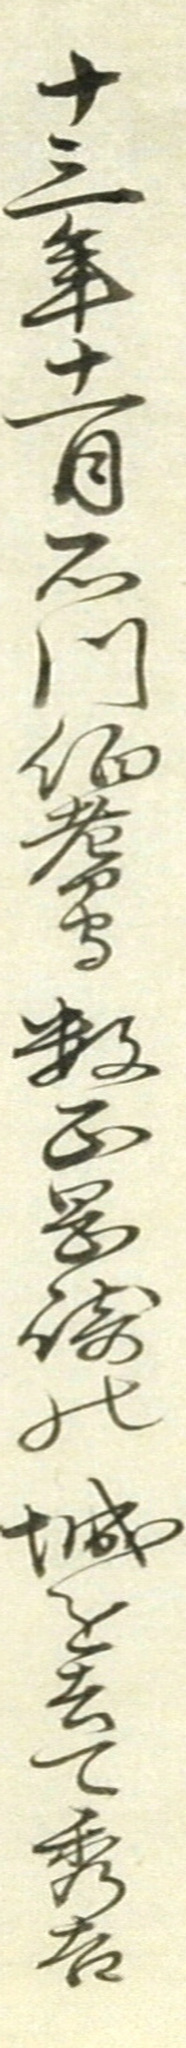十三年十一月石川伯耆守数正岡崎の城を去て秀吉
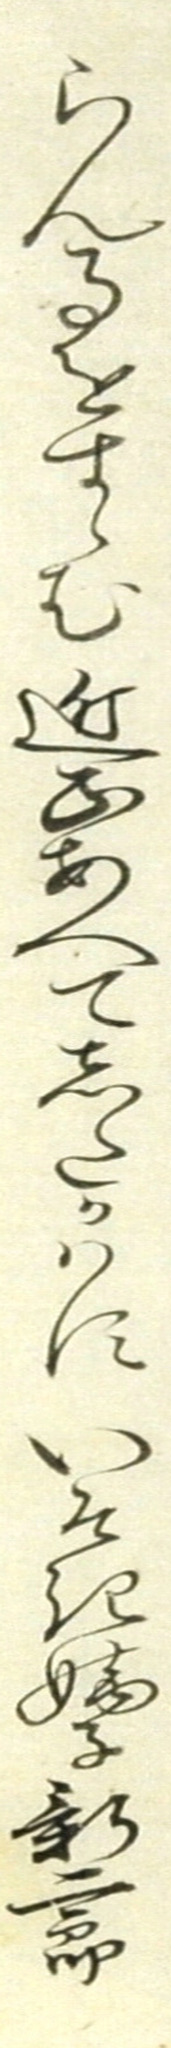らん事をすゝむ近正あへてしたかはすいそき嫡子新二郎
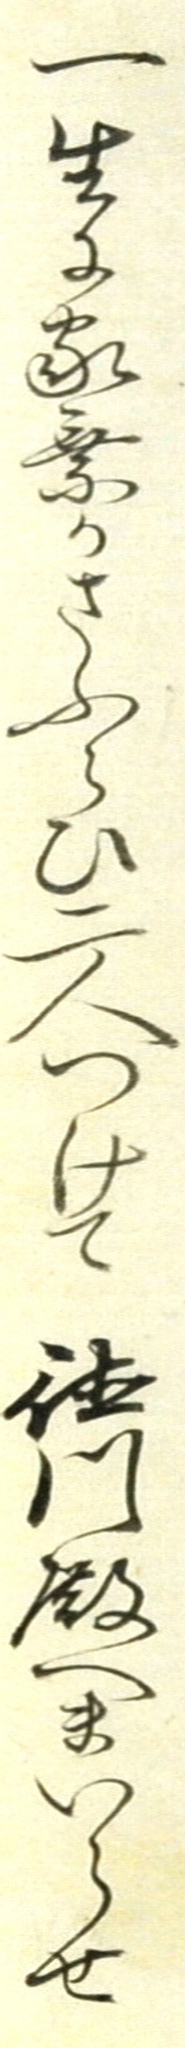一生に家乗かさふらひ二人つけて徳川殿へまいらせ

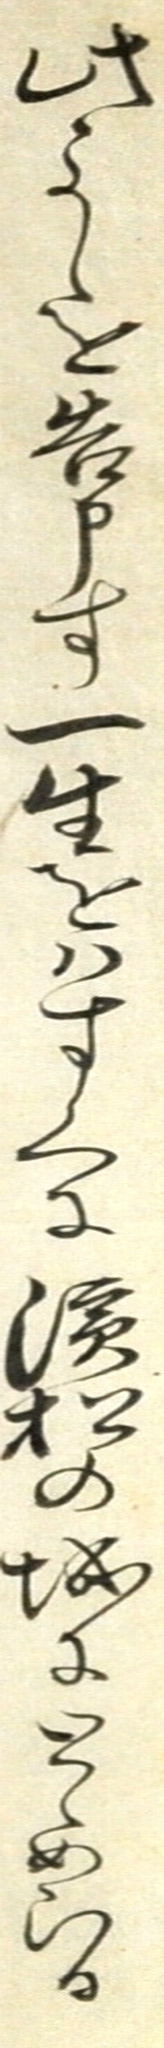此よしを告申す一生をはすくに浜松の城にとゝめらる
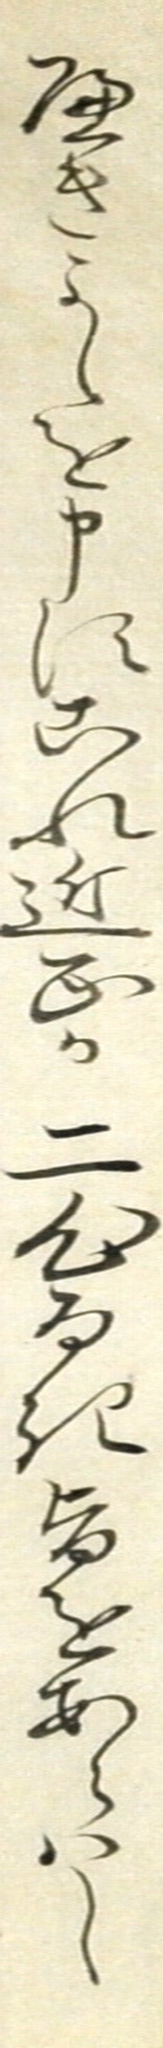へきよしを申すこれ近正か二心なき旨をあらはし
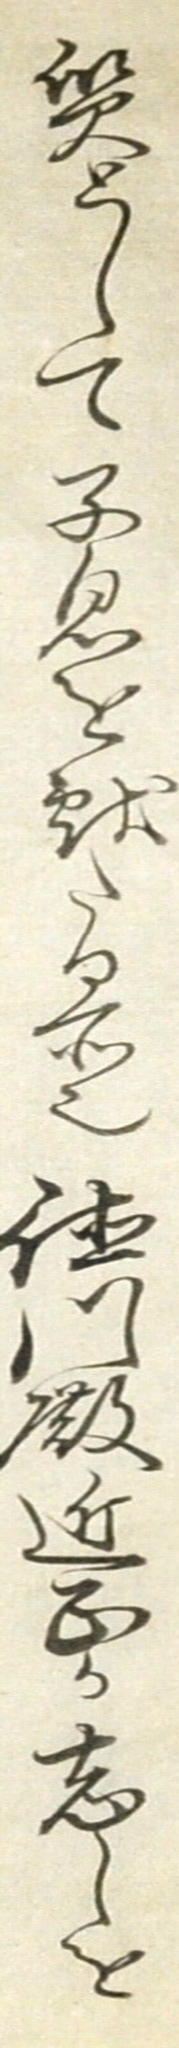質として子息を献たる所也徳川殿近正か志しを
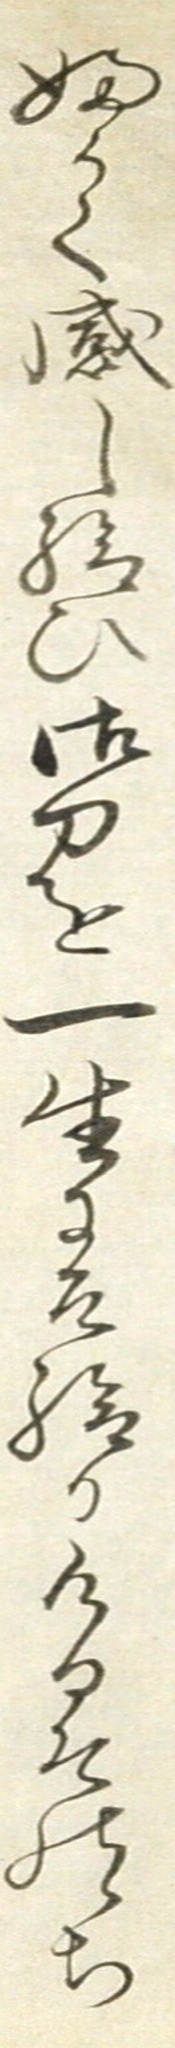ふかく感し給ひ御刀を一生にそ給りけるそのゝち
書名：藩翰譜（二・三）
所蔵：伊那市立高遠町図書館・合同会社AMANE
